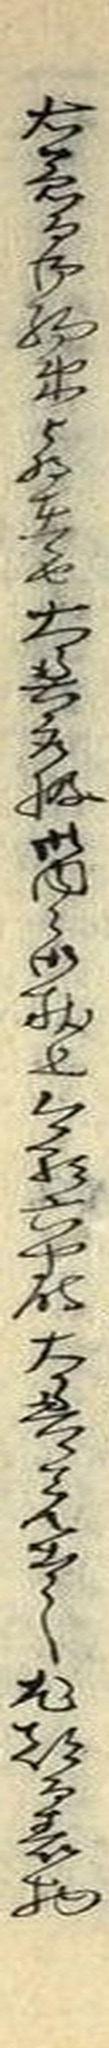右兼而御約束被為在候由大奥取扱御内々御献上今朝六半時大奥へ差出之尤都而表物
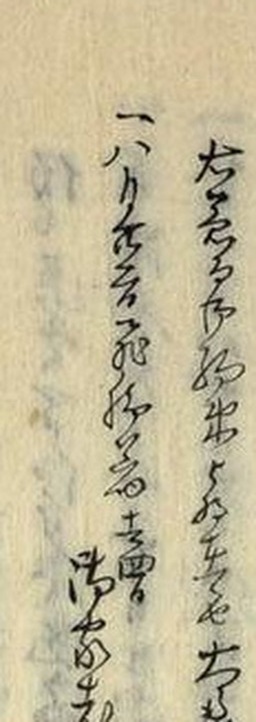一八月廿二日飛脚着去四日
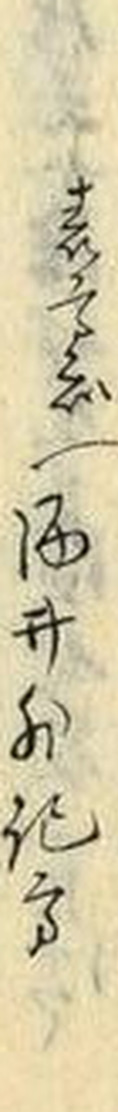表高知酒井外記方
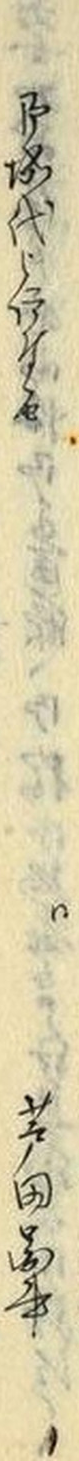御城代被仰付候由同芦田図書
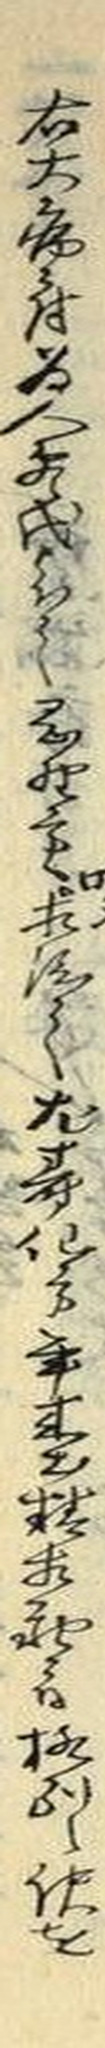右大病ニ付為人受代被下之岡野方へ昨夕相渡之尤寿仙方年来出精相勤候ニ付格別之訳を
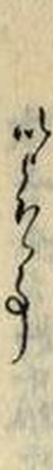以被下候事
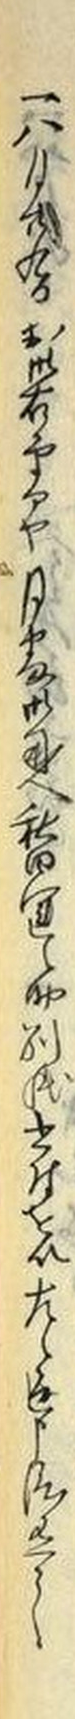一八月廿九日於御右筆部屋月番御用人秋田運之助別紙書付を以左之通申渡有之
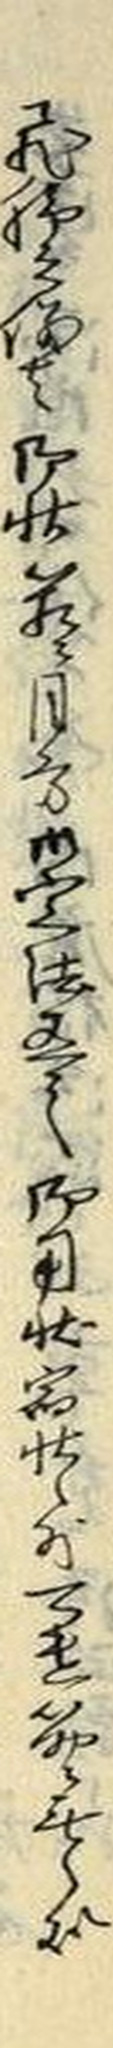飛脚之儀者御状箱ニ目方御定法有之御用状宿状之外可遣筋ニ無之処
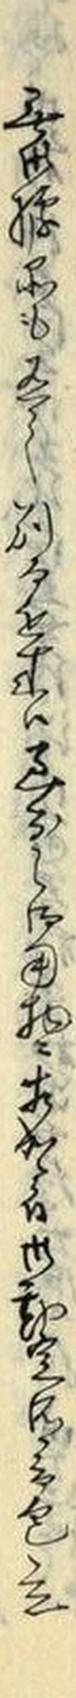無御拠品も有之別而近来ハ過分之御用物ニ相成候ニ付御勘定所ニ而包立
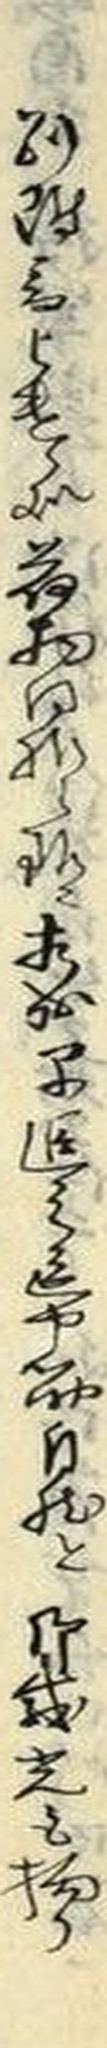別附ニ而被遣候処荷物同様之趣ニ相成早追之道中筋自然と御威光も拘り
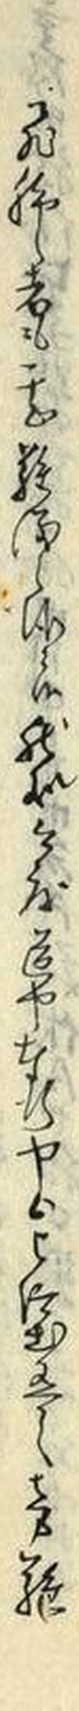飛脚之者も甚難儀之趣ニ候然処今度道中奉行中ゟ被仰出有之旁難
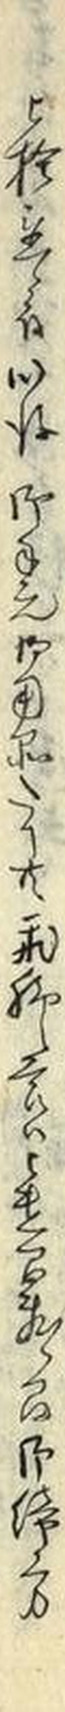被捨置候ニ付以後御手元御用品たり共飛脚之節ハ被遣間敷候間御締方
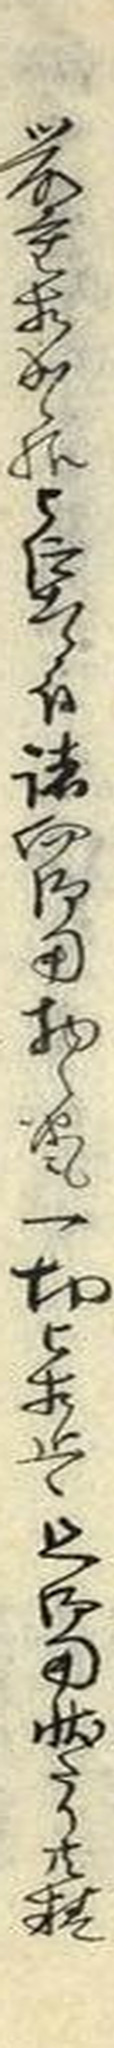厳重相成候様被仰出候ニ付諸向御用物之儀も一切被相止候且御用状たり共精
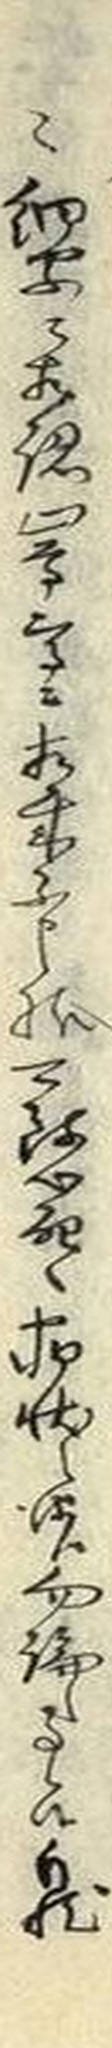々細字ニ相認嵩高ニ相成不申様可致心配候家状之儀ハ勿論之事ニ候自然
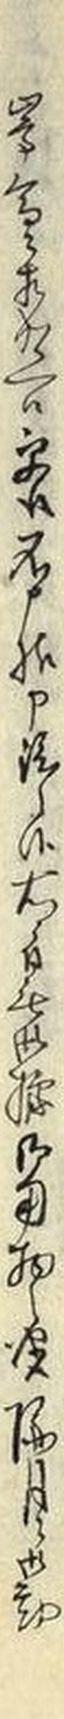嵩高ニ相成候ヘハ受取不申様申渡候様右ニ付無御拠御用物之儀ハ隔月ニ御勘
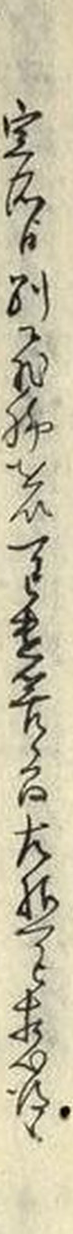定所ゟ別飛脚を以可被遣筈之間左様可被相心得候
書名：少傅日録抄（斉善付側向頭取日記、在府）
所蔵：福井県文書館 Fukui Prefectural Archives
